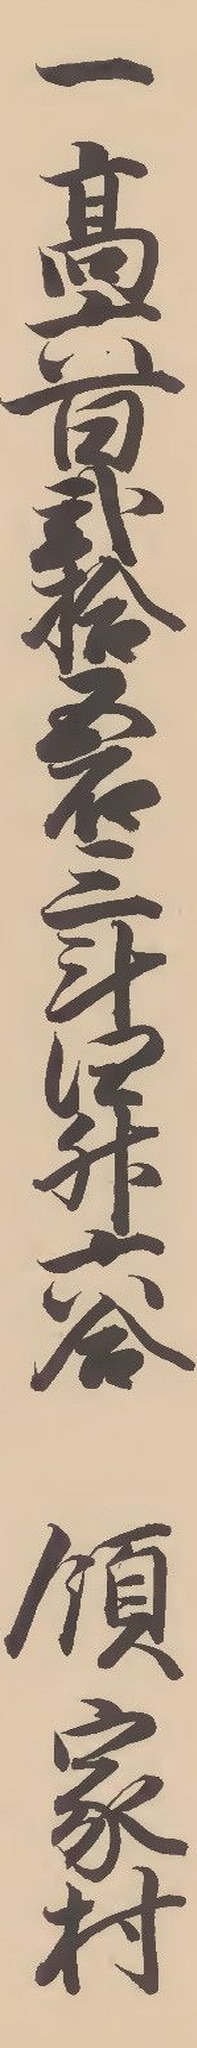一高六百弐拾五石三斗四升六合領家村
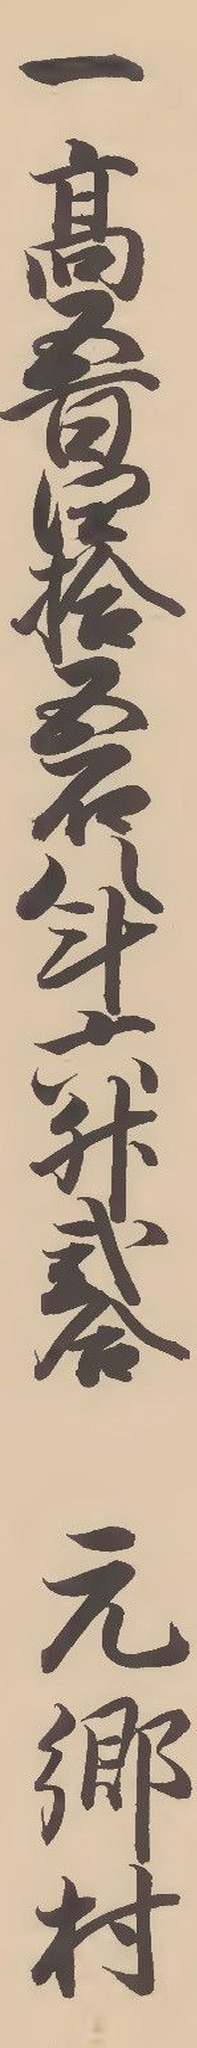一高五百四拾五石八斗六升弐合元郷村
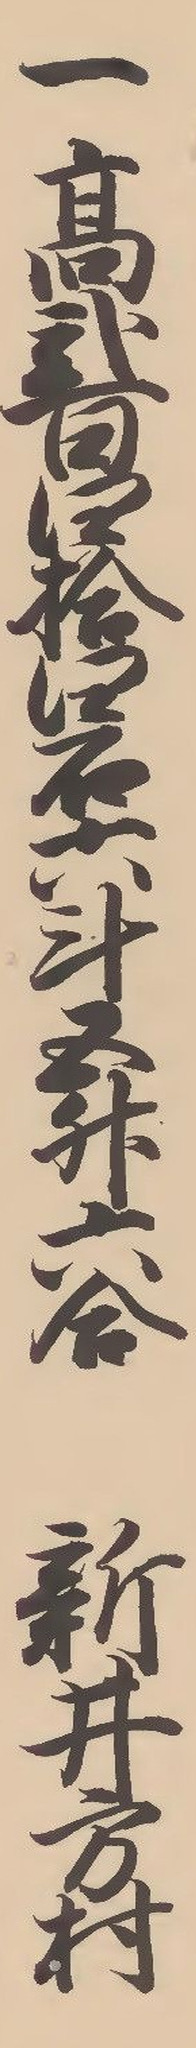一高弐百四拾四石六斗五升六合新井方村
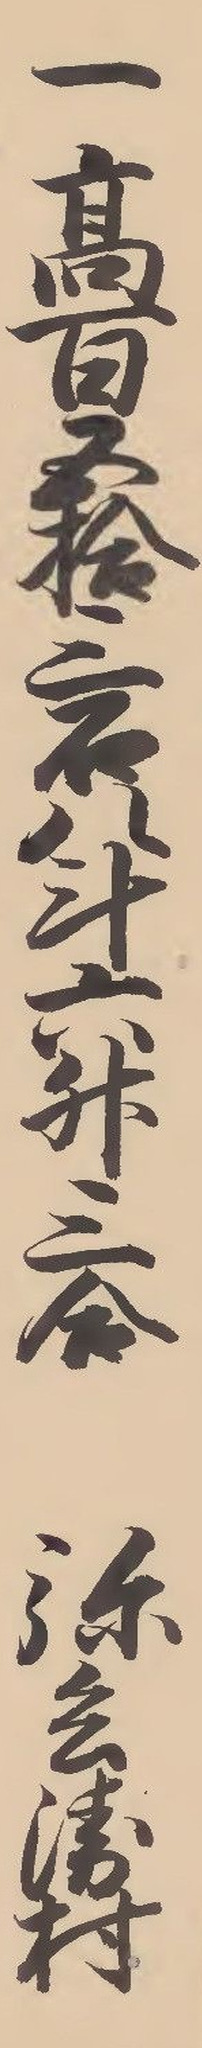一高百五拾三石八斗六升三合弥兵衛村
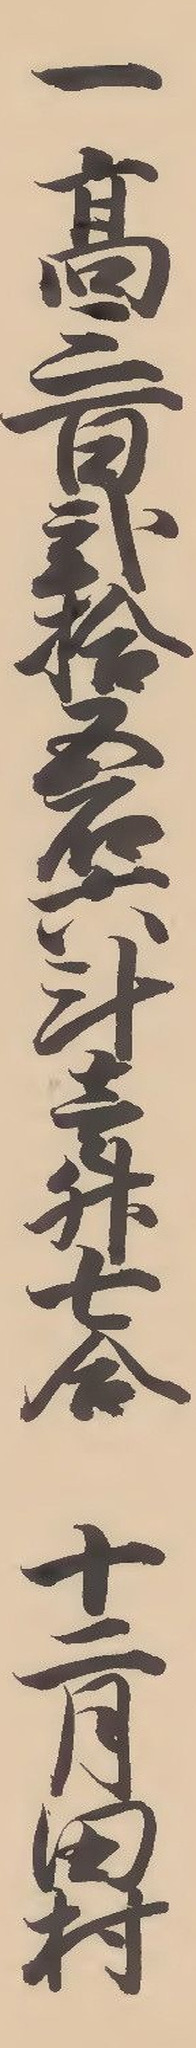一高三百弐拾五石六斗壱升七合十二月田村
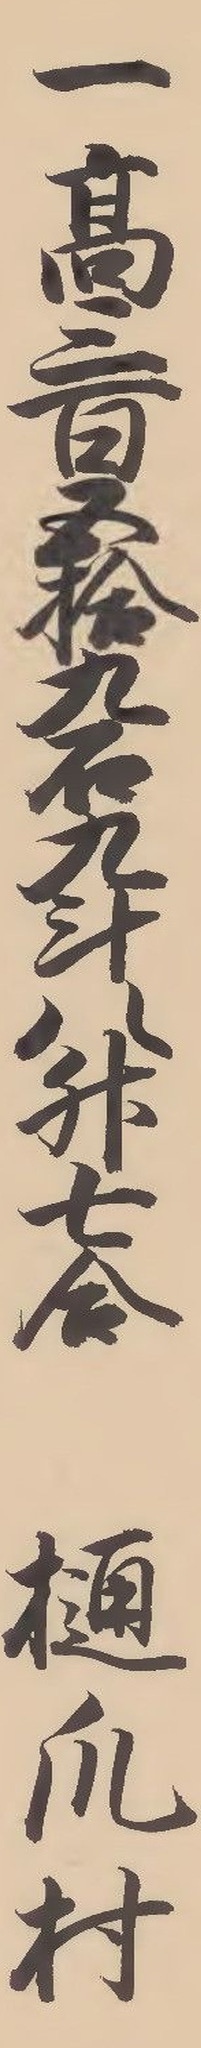一高三百五拾九石九斗八升七合樋爪村
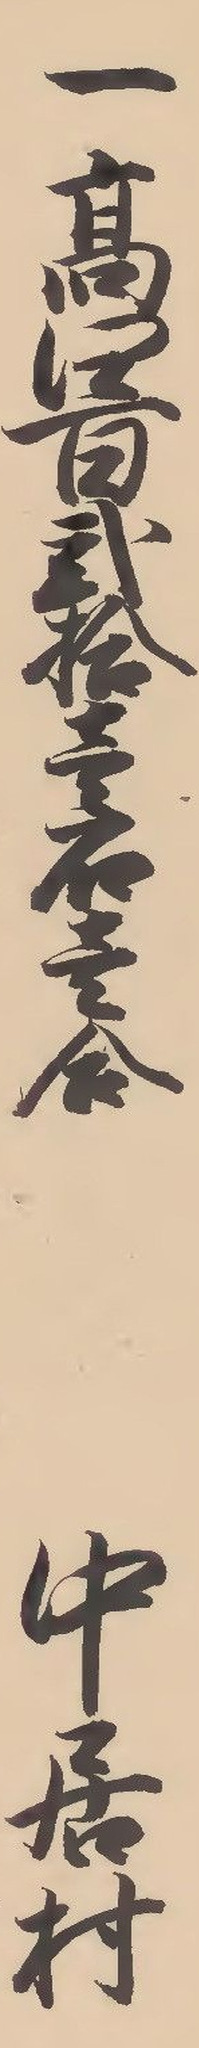一高四百弐拾壱石壱合中居村

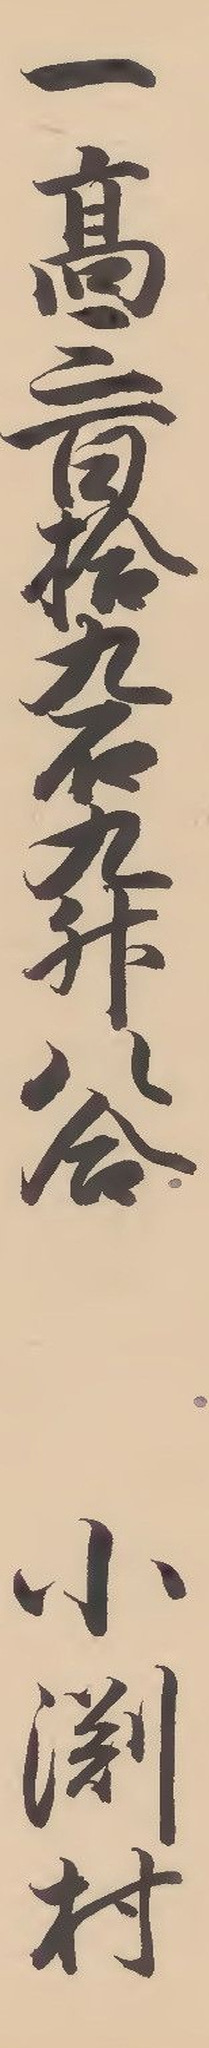一高三百拾九石九升八合小渕村
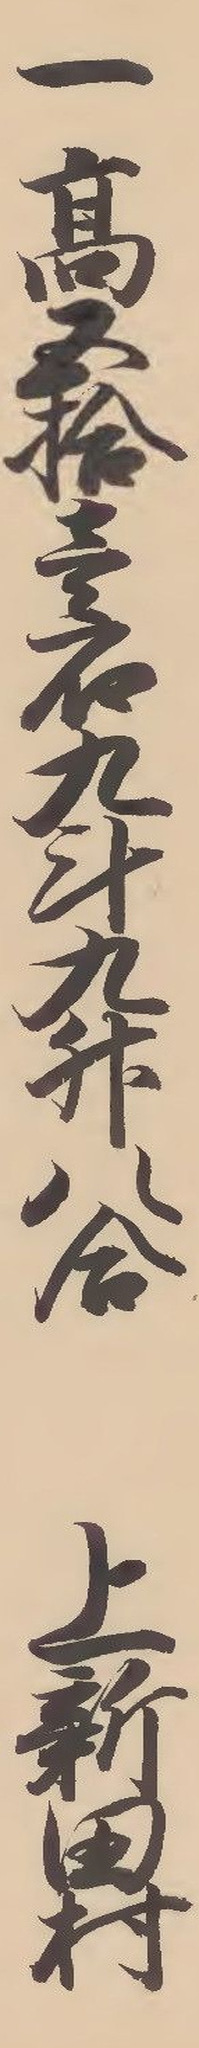一高五拾壱石九斗九升八合上新田村
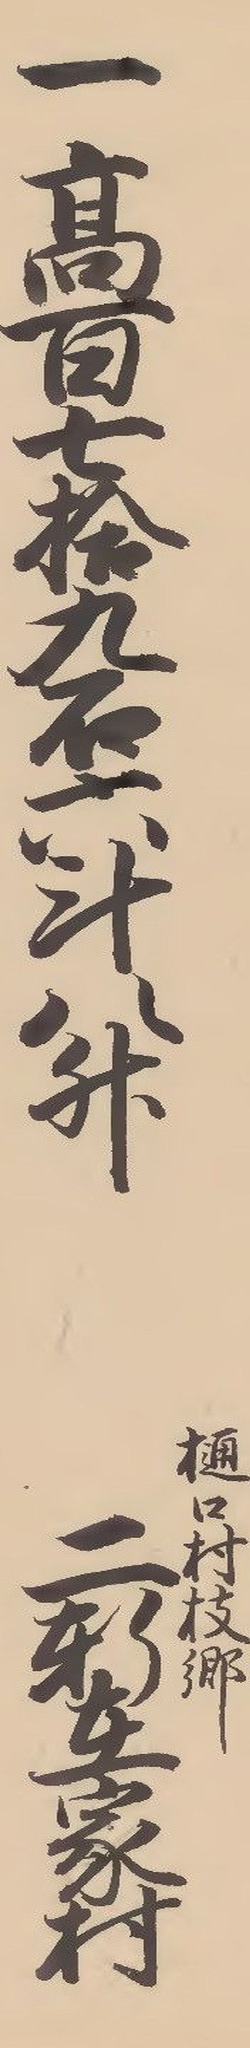一高百七拾九石六斗八升二軒在家村
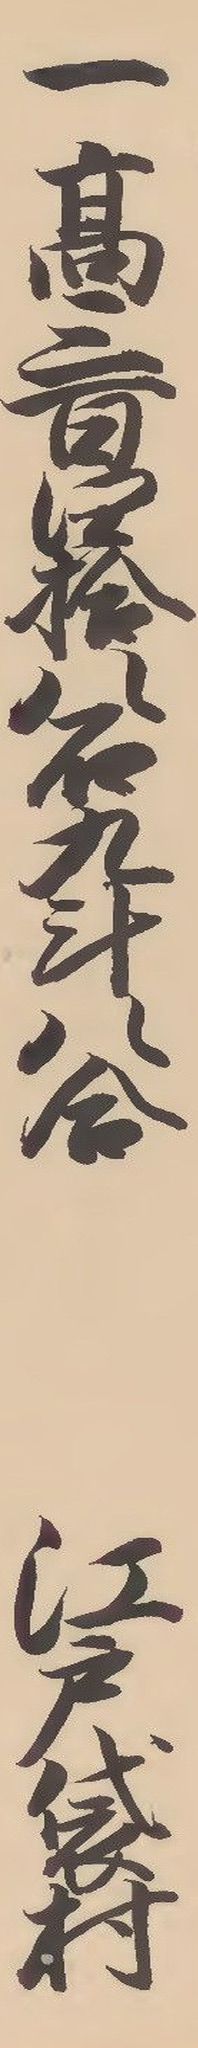一高三百四拾八石九斗八合江戸袋村
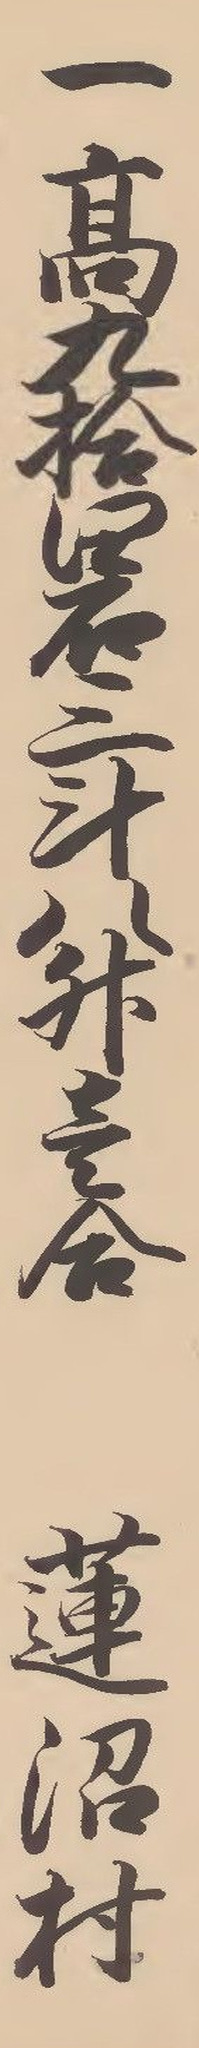一高九拾四石三斗八升壱合蓮沼村
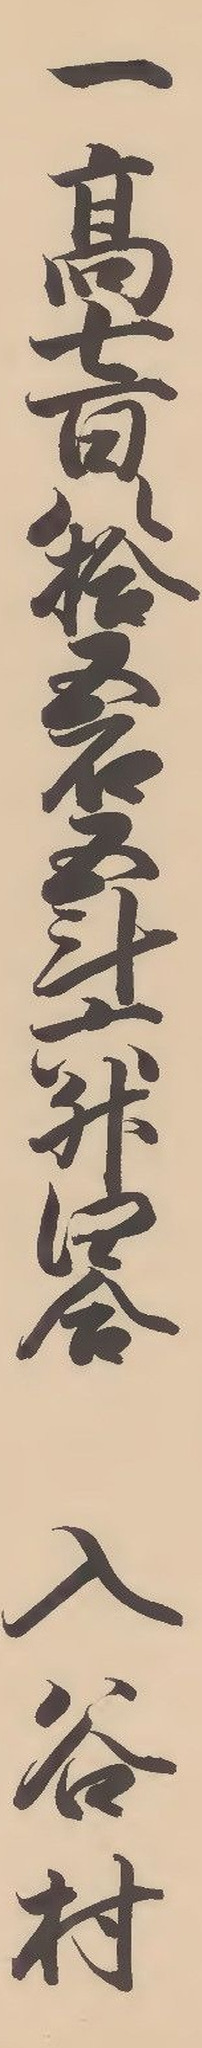一高七百八拾五石五斗六升四合入谷村
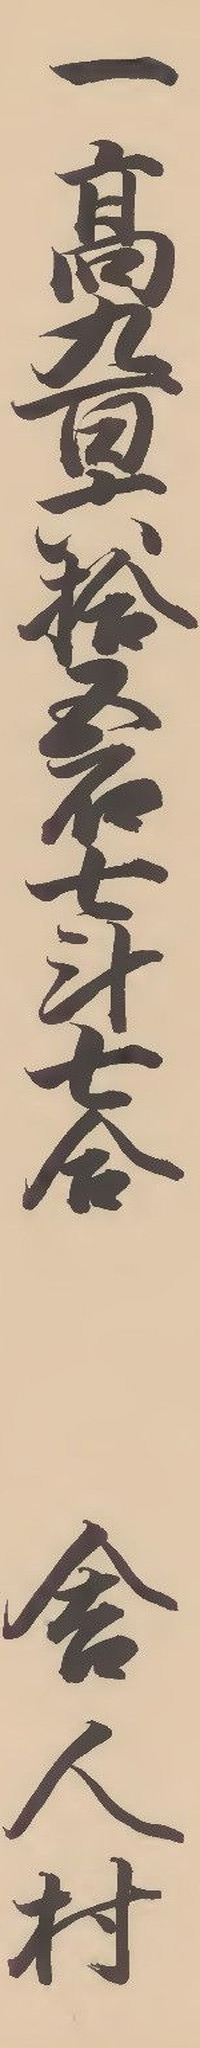一高九百六拾五石七斗七合舎人村
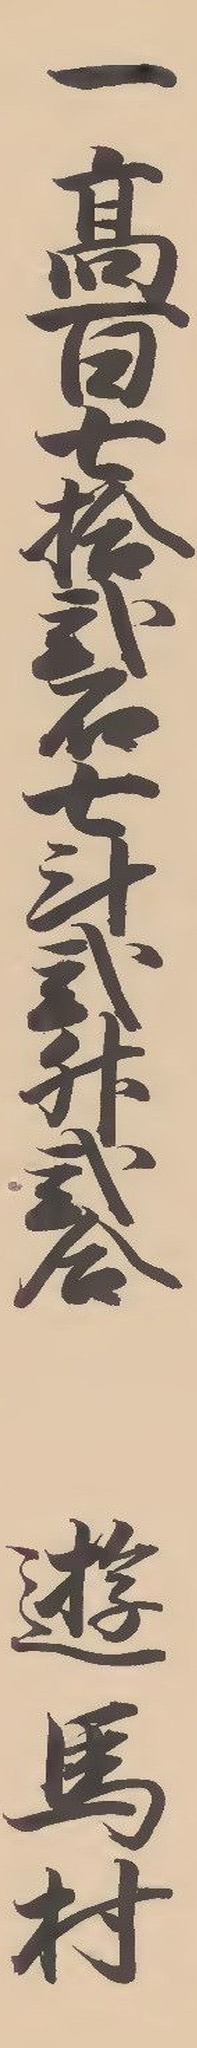一高百七拾弐石七斗弐升弐合遊馬村

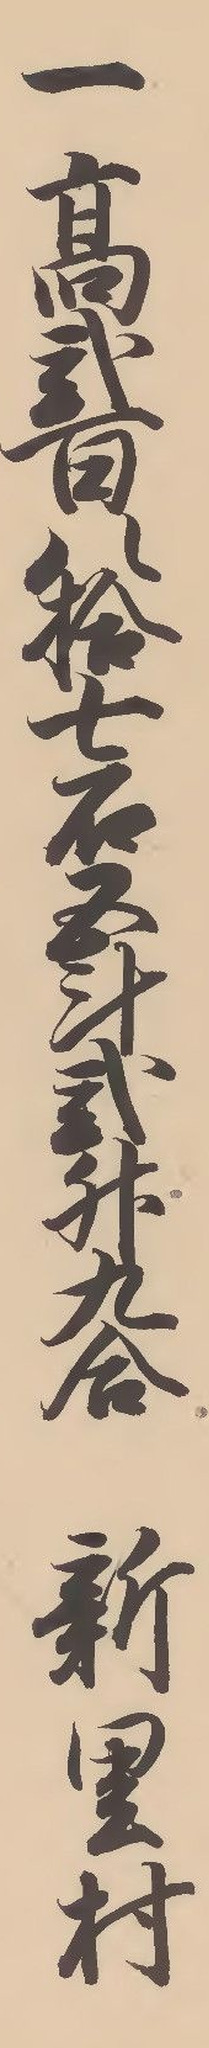一高弐百八拾七石五斗弐升九合新里村
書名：武蔵国郷帳　下
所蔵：国立公文書館 National Archives of Japan
